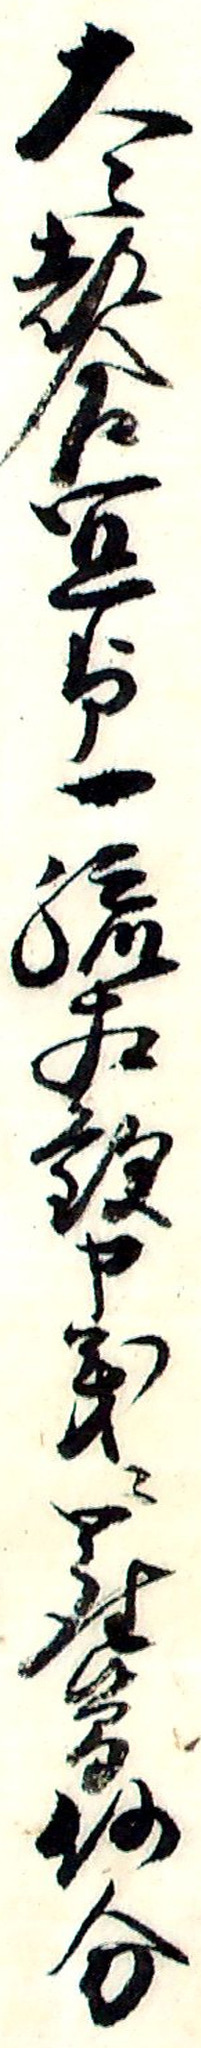大ニ都合宜布一統相歎申義ニ御座候間何分

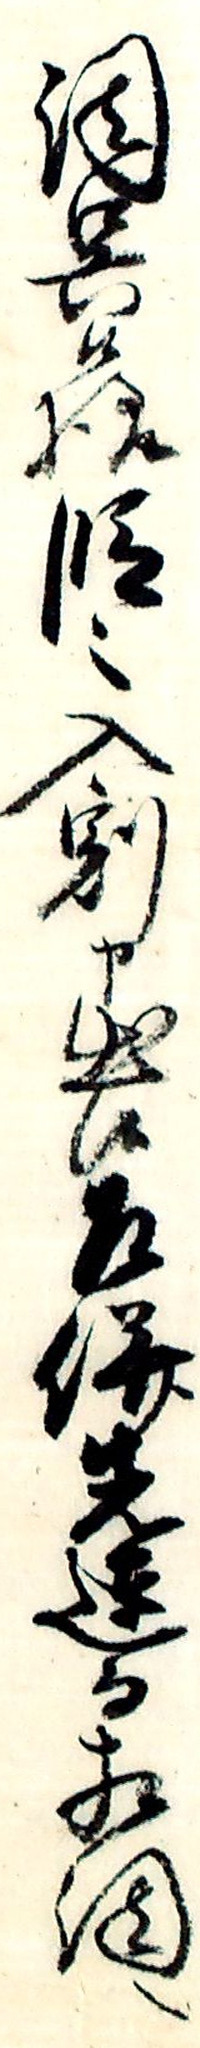調呉候様段々入割申出候乍併先達而相調へ
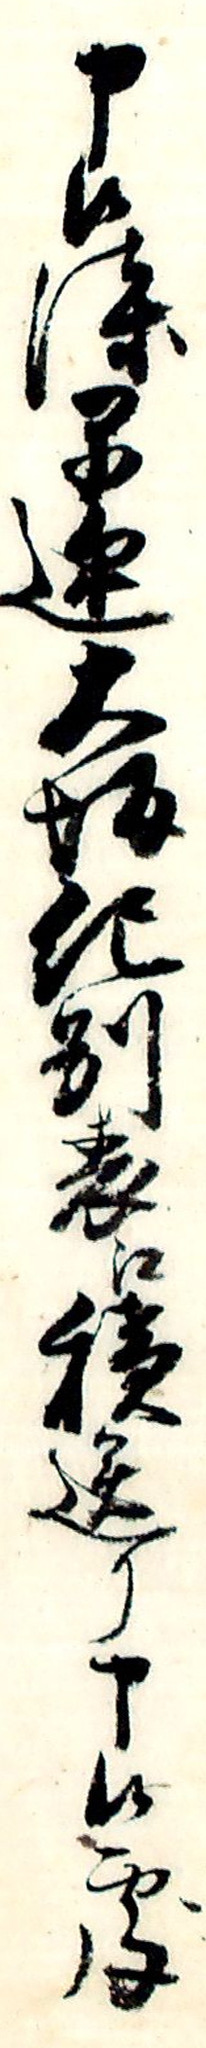申候漆早速大坂紀州表江積送り申候處
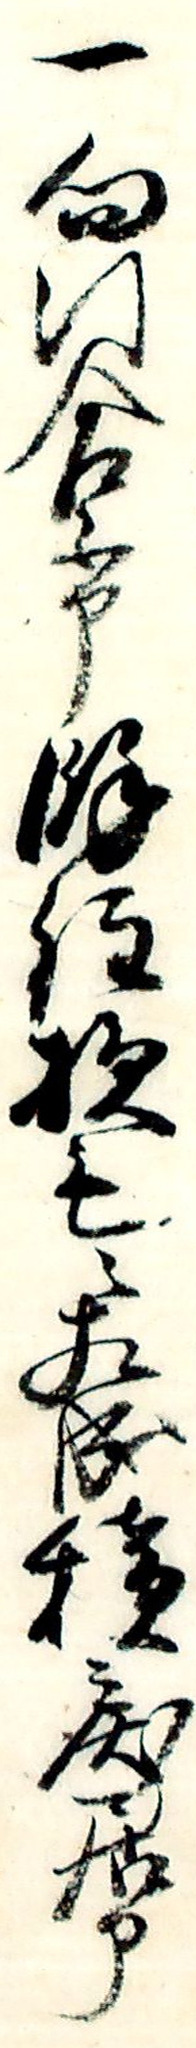一向引合不申餘程損耗ニ相成積戻居申
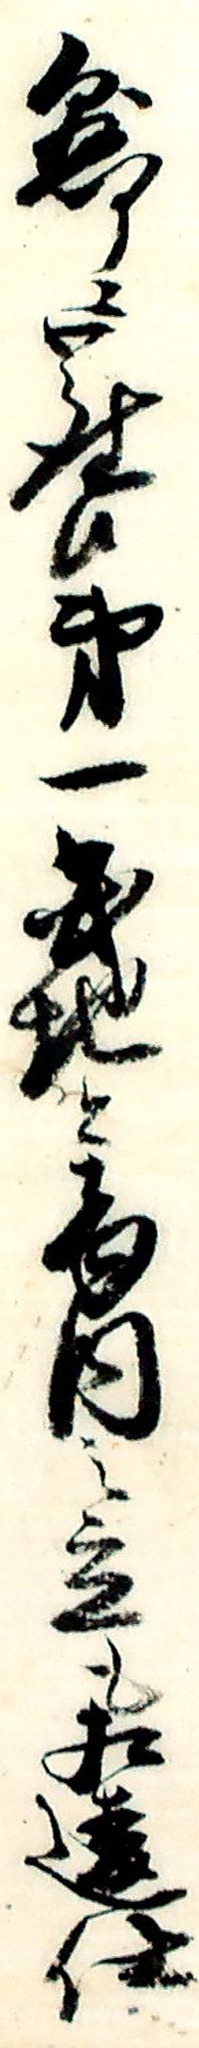懸りニ御座候第一當地と商内之立も相違仕
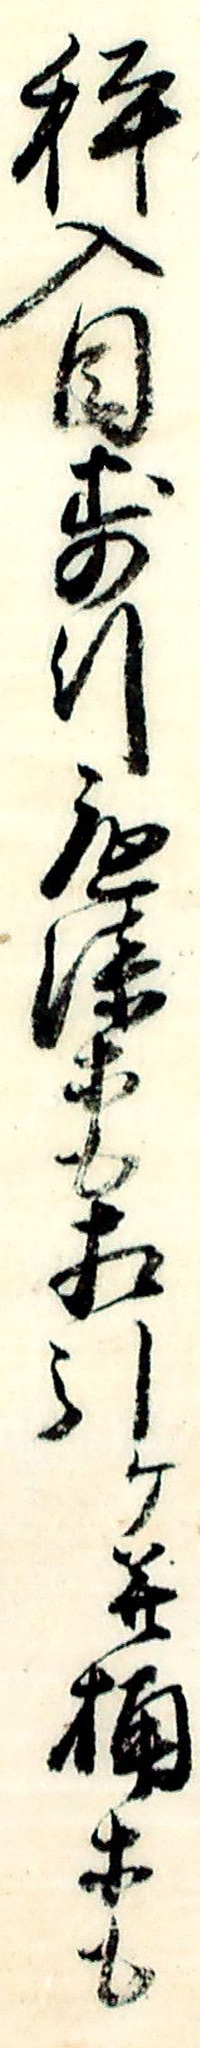秤入目歩引庭漆等も相引ケ幷桶等も
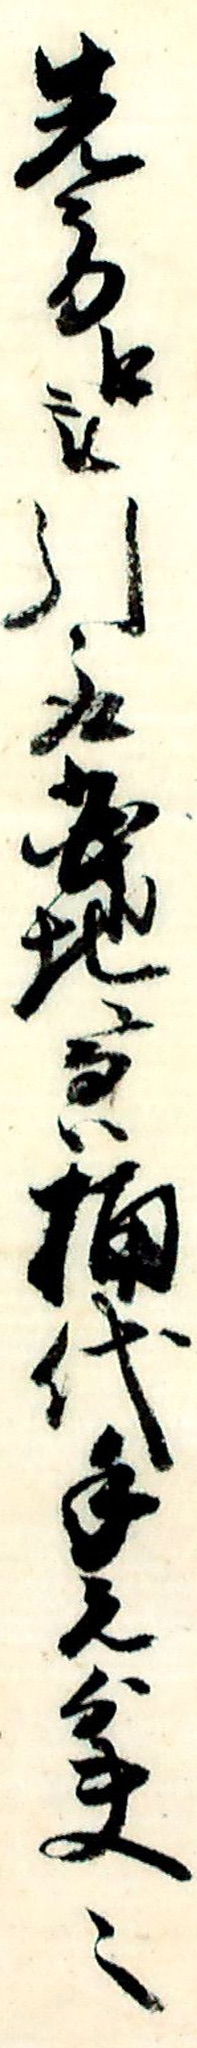先方江被引取當地ニ而ハ桶代手元ゟ夫々
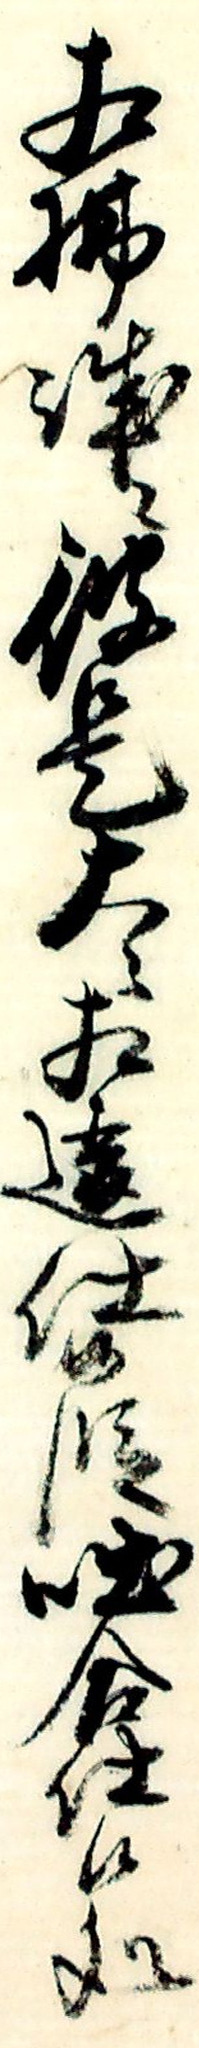相拂誠ニ彼是大ニ相違仕候段咄合仕候処
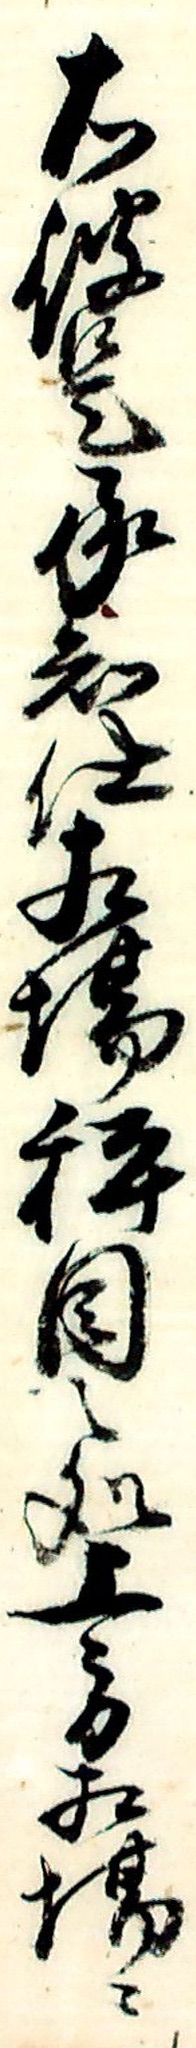右彼是承知仕相場秤目之処上方相場ニ
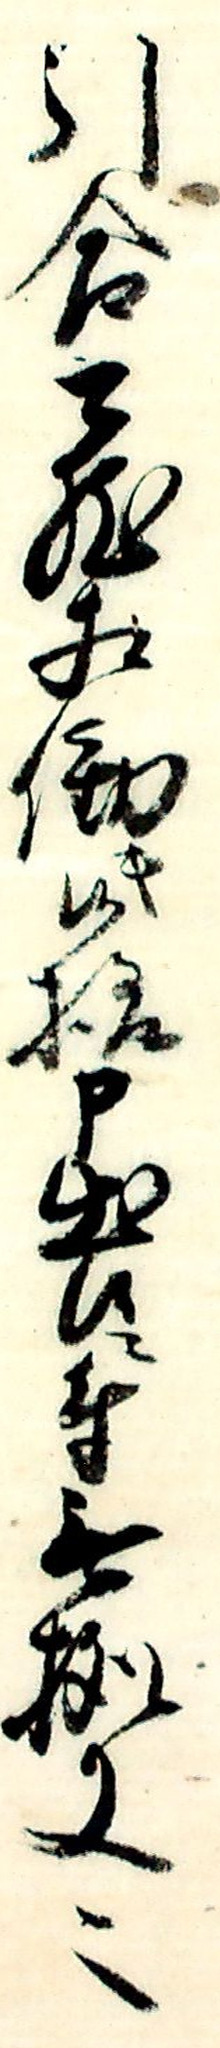引合可然相働き候様申出候に付無拠又々
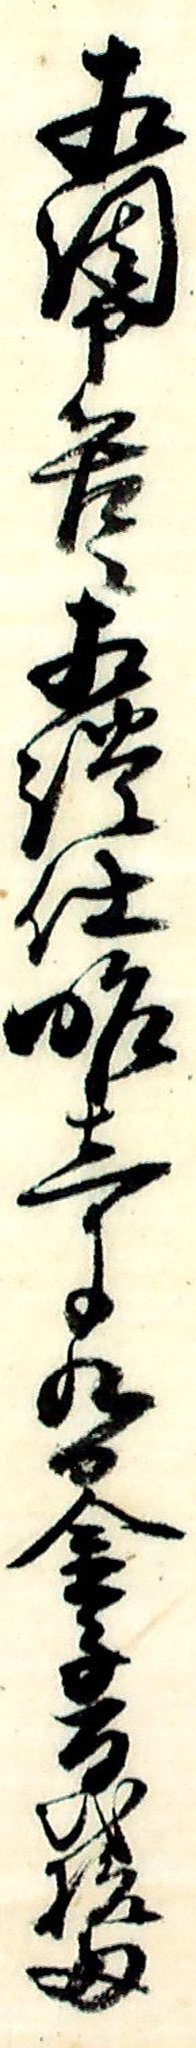相調申筈に相談仕昨十二月九日金子百弐拾両
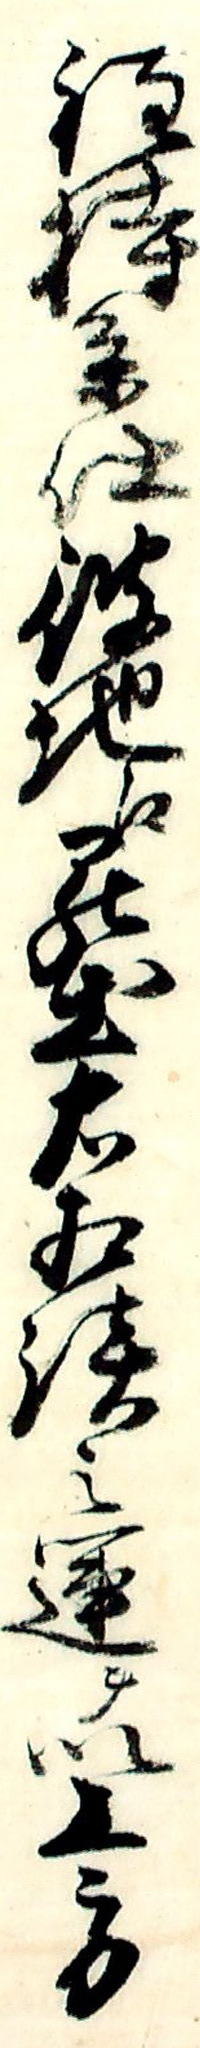程持参仕彼地江罷出右相談之運ヲ以上方
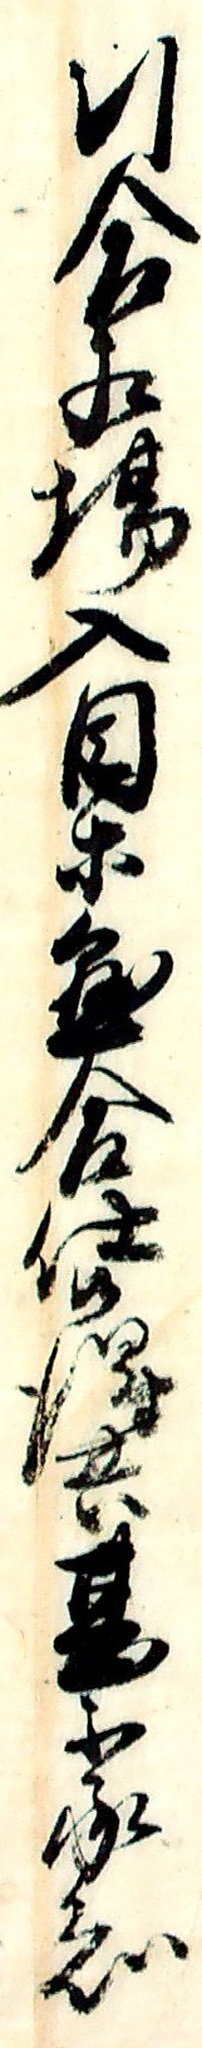引合相場入目等懸合仕候得共甚不承知
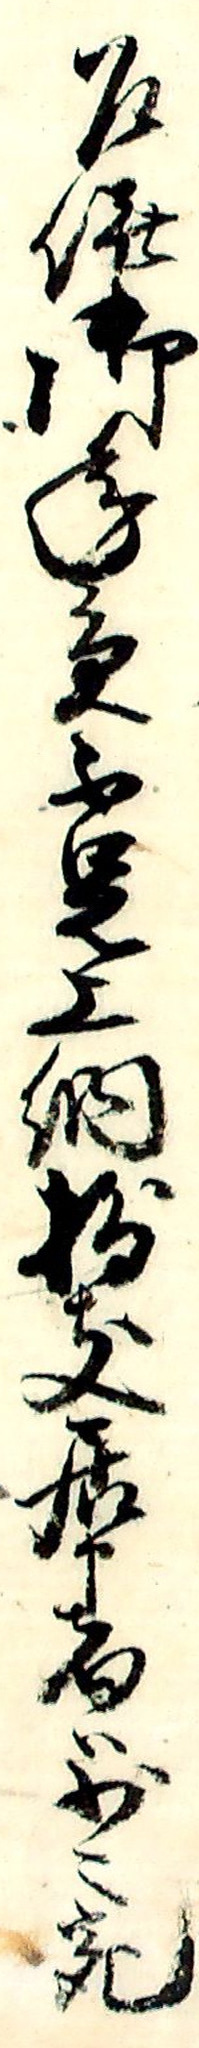乍併御年貢不足上納指支居申者ハ少々宛
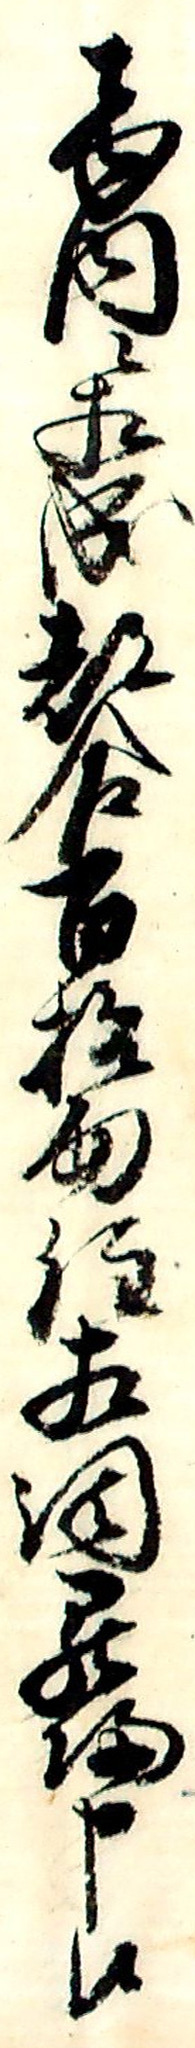商内ニ相成都合百拾両程相調罷帰申候
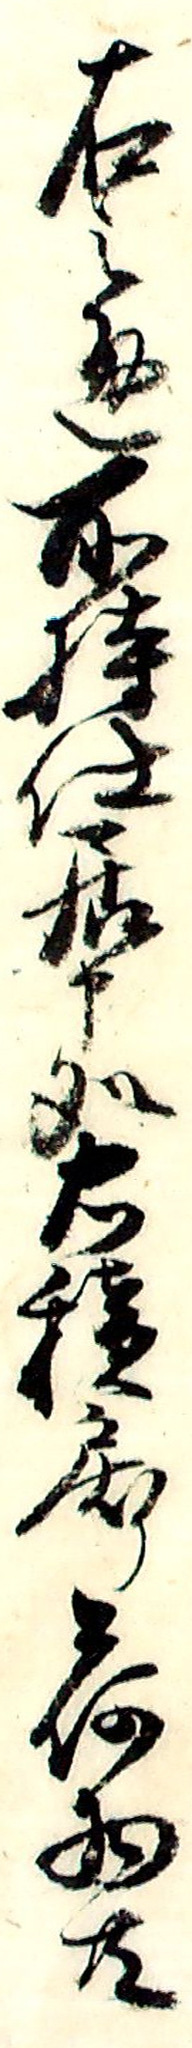右之通所持仕居申処右積戻り荷物共
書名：奉申上覚（山城谷漆仕入買入銀主之義に付）
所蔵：鳴門教育大学 Naruto University of Education
